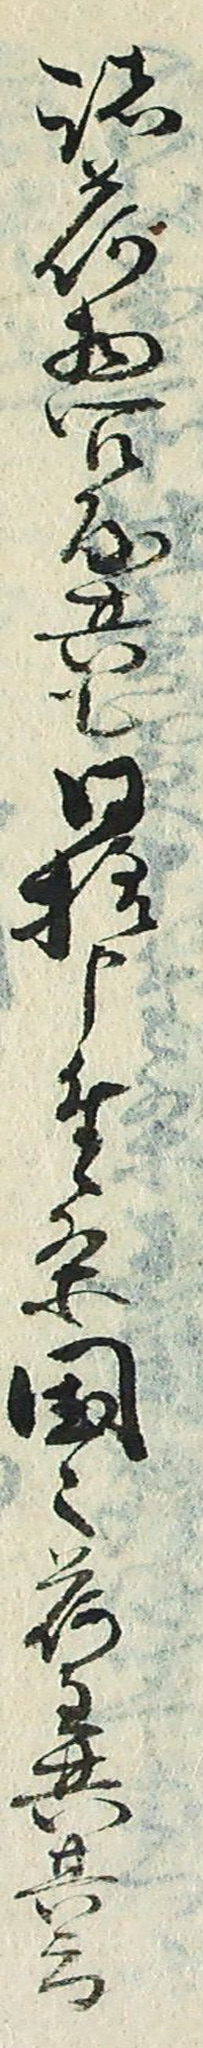諸荷物問屋共も同様申付候条国々荷主共其旨
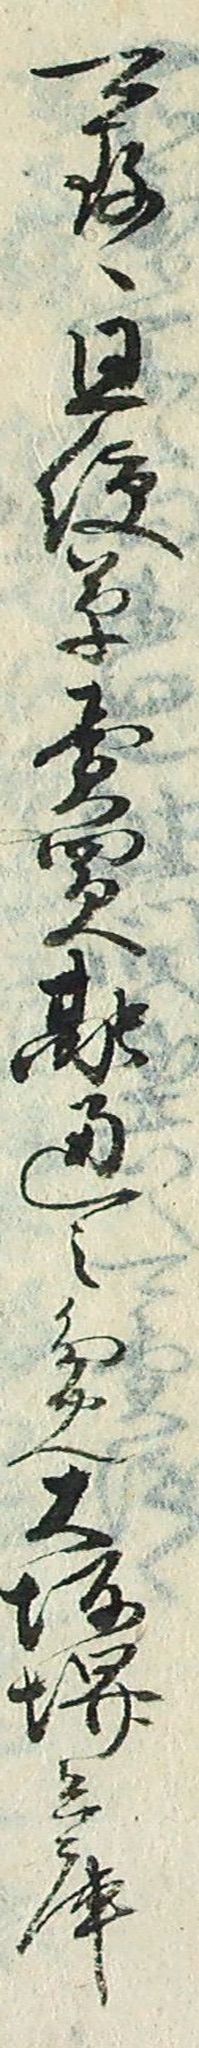可存候且絞草賣買融通之ため大坂堺兵庫
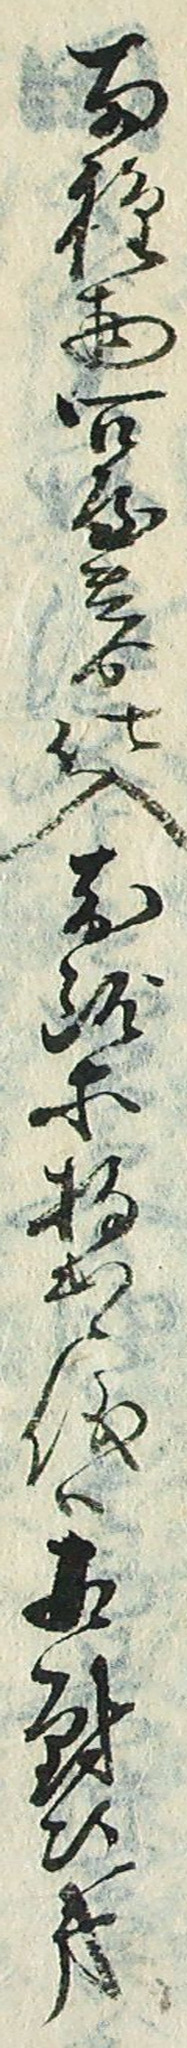両種物問屋共ゟ仕入前銀等指出候儀は相對次第
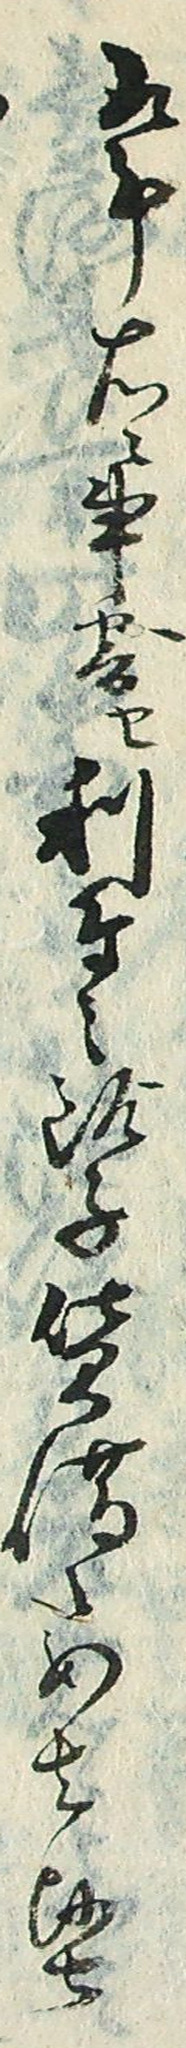取計右に事寄せ利付之銀子貸借候義者堅
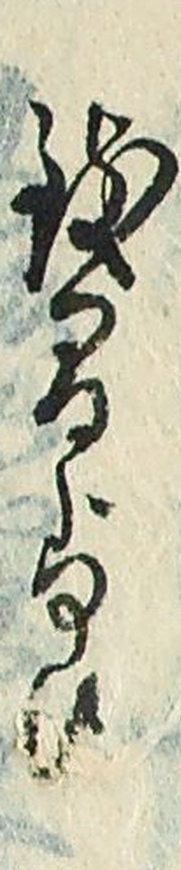致間布候
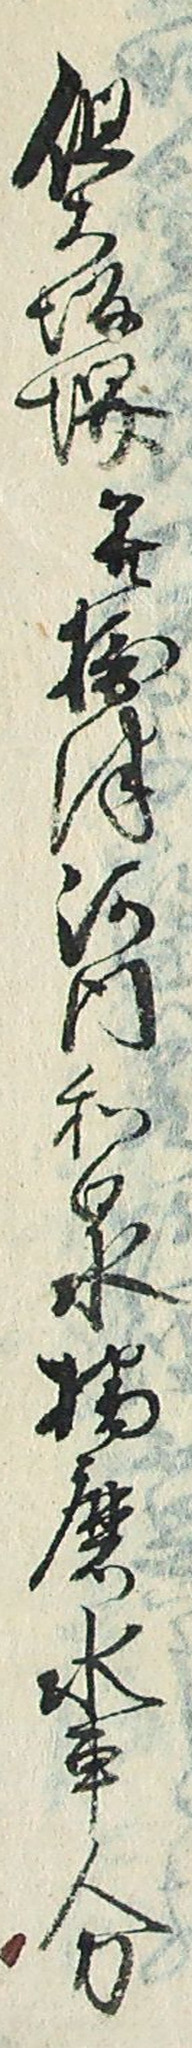但大坂堺幷摂津河内和泉播磨水車人力

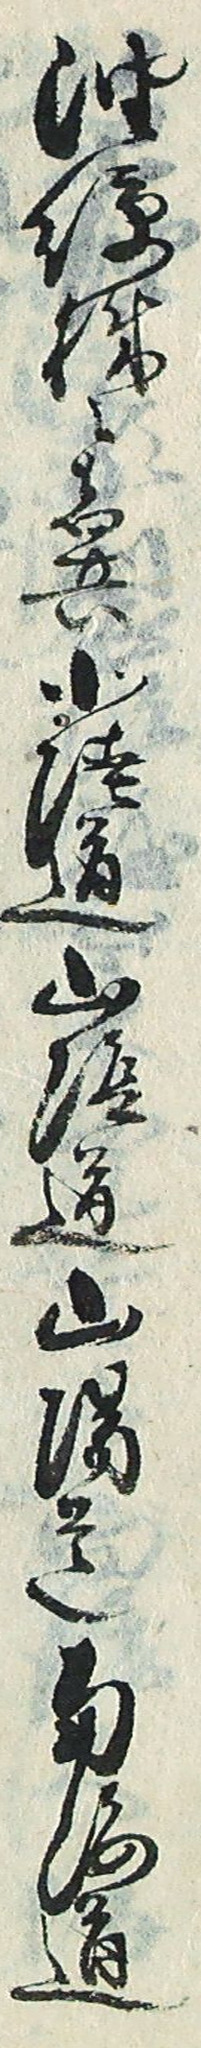油絞株之者共北陸道山陰道山陽道南街道
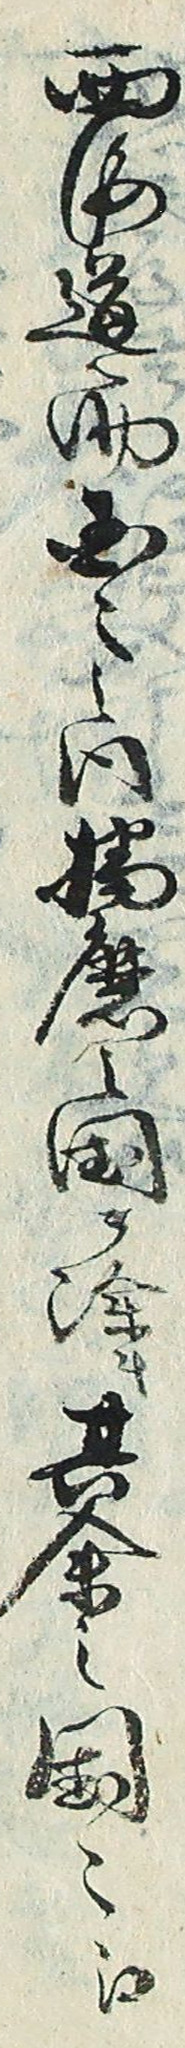西海道筋国々之内播磨之国を除き其余之国々江
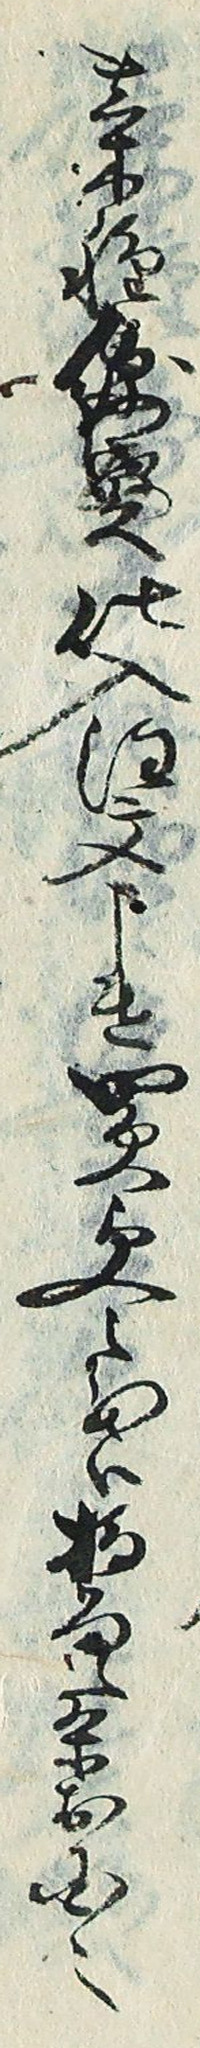菜種綿実仕入注文申遣買受之義は指留候条於国々
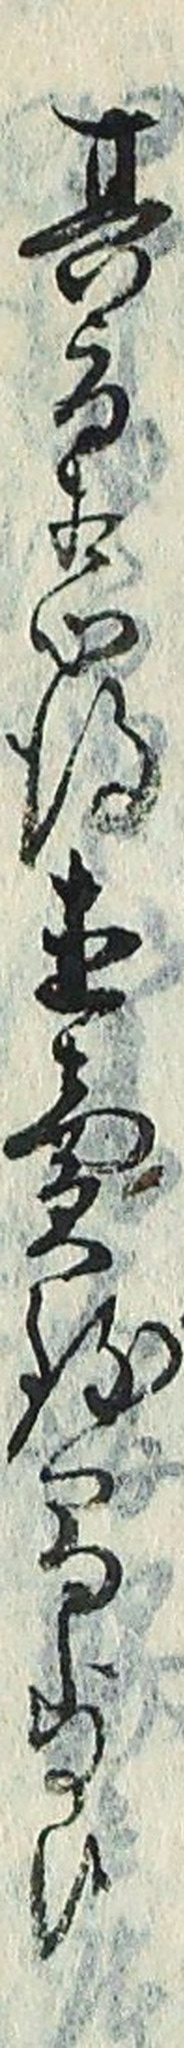其旨相心得直売致間布候
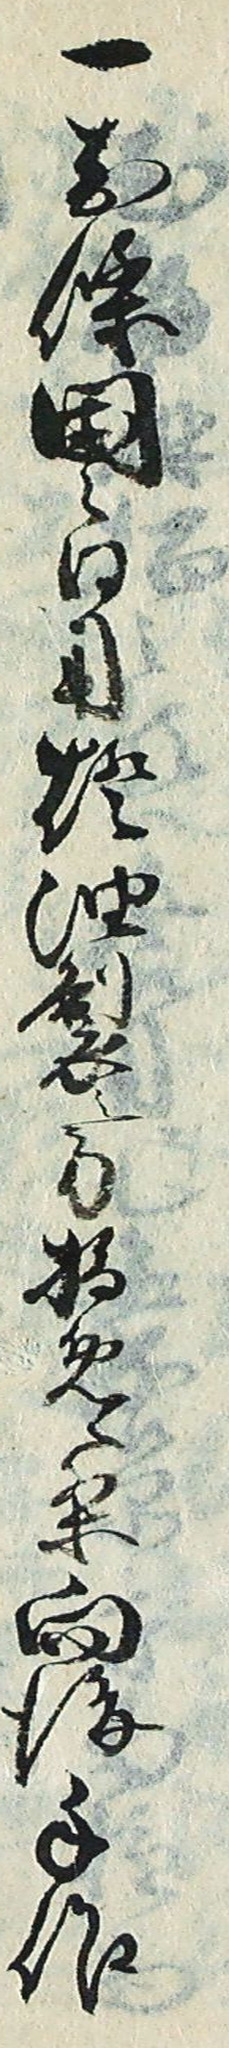一前條国々日用燈油製し方指免候条向後手作
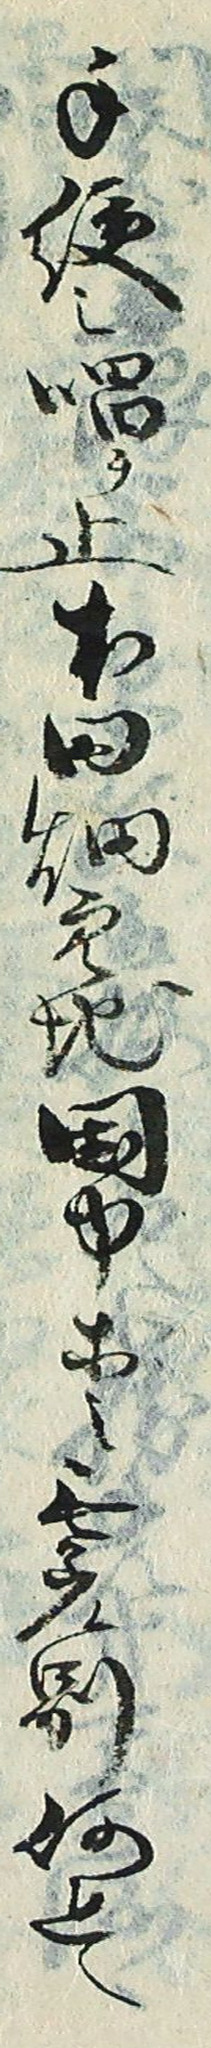手絞之唱を止本田畑空地国中等之無差別何連へ
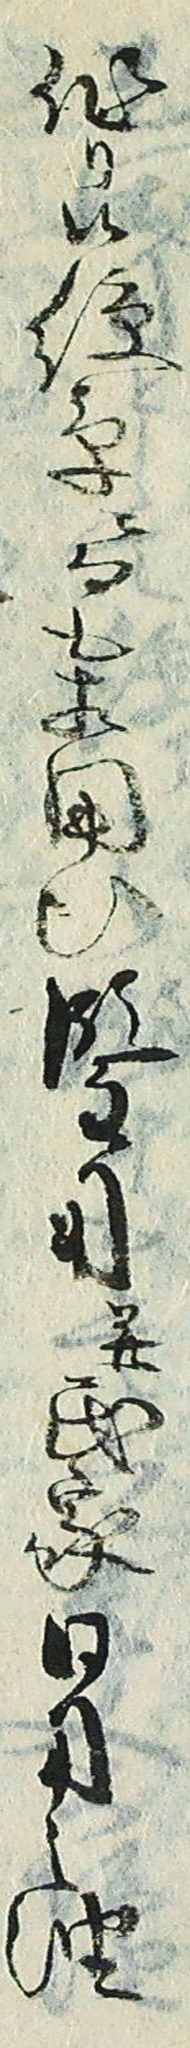作り候絞草に而も相用ひ領主用幷武家日用之油
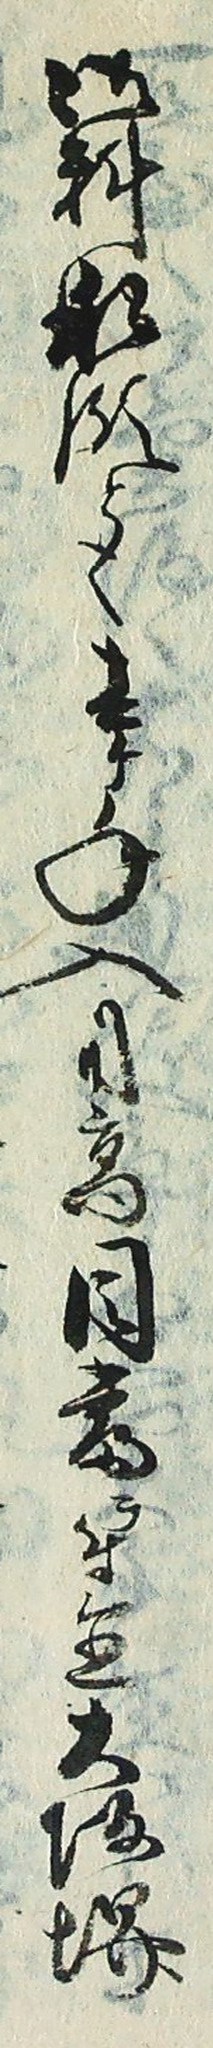御料私領とも壱ケ年入用高目当を付置大坂堺
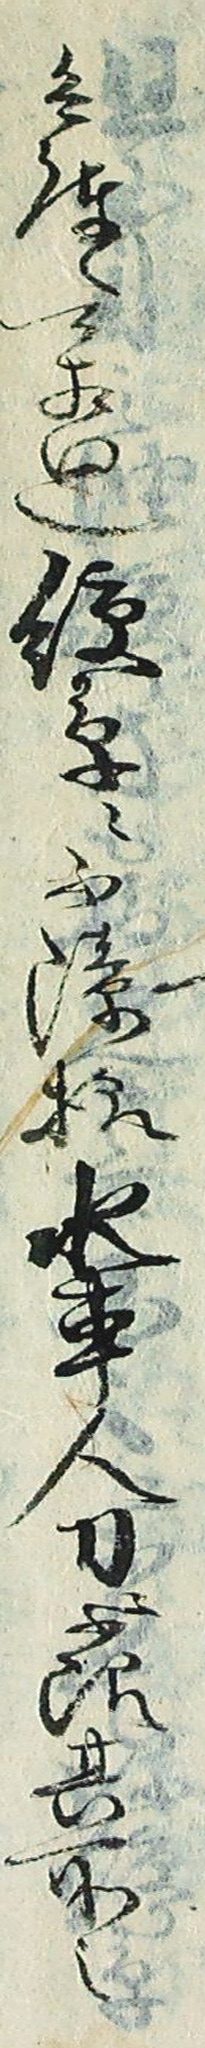兵庫へ可相廻絞草に不障様水車人力に不限其所之
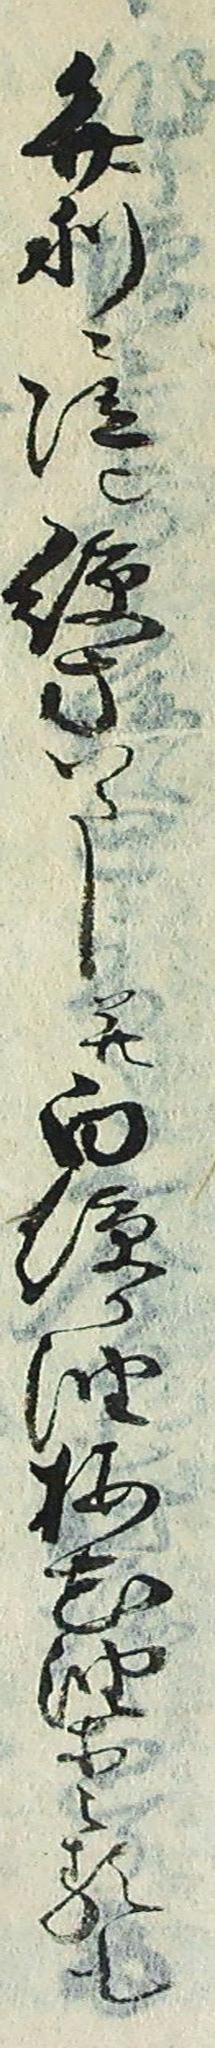弁利に随ひ絞方いたし幷白絞り油梅花油等之類も
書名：油稼御取究ニ附御箇條書テ以被仰渡南北同役申談御答書控
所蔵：鳴門教育大学 Naruto University of Education
